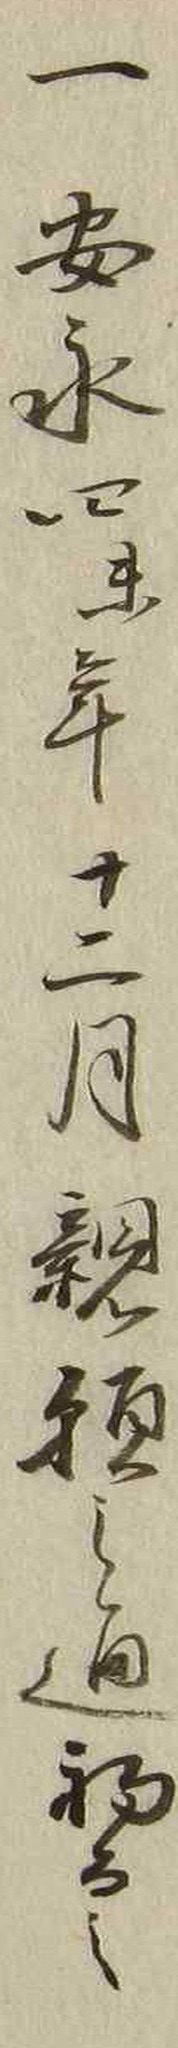一安永四未年十二月親願之通初而之
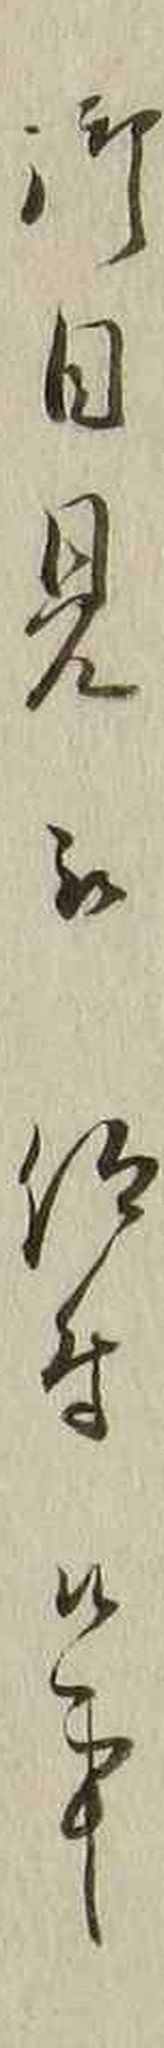御日見被仰付候事
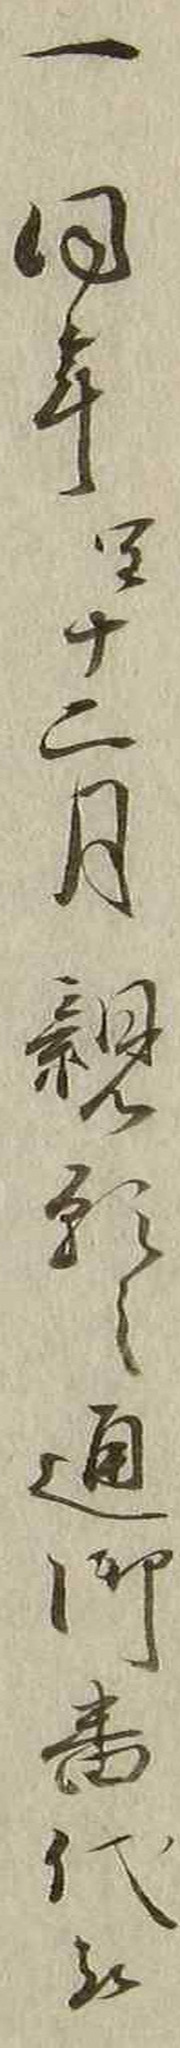一同年閏十二月親願之通御番代被
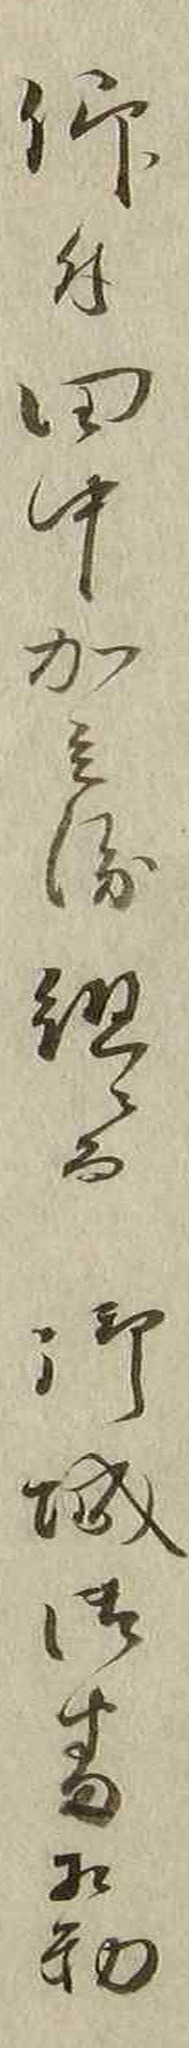仰付田中加兵衛組ニ而御城御番相勤
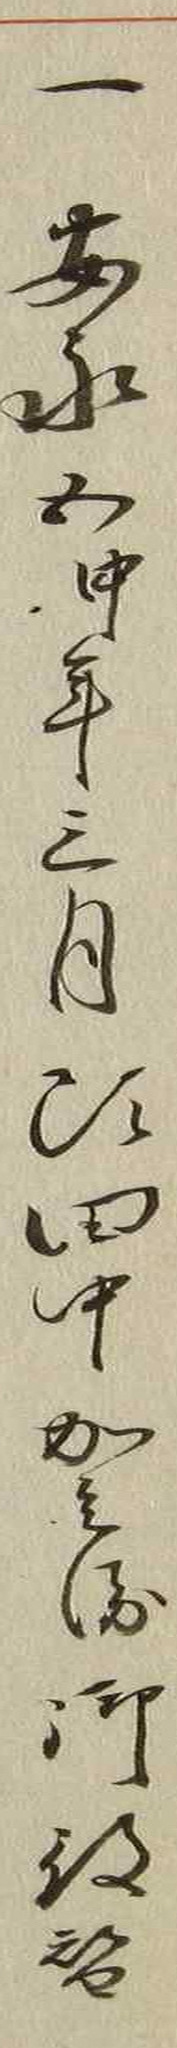一安永五申年三月頭田中加兵衛御役替
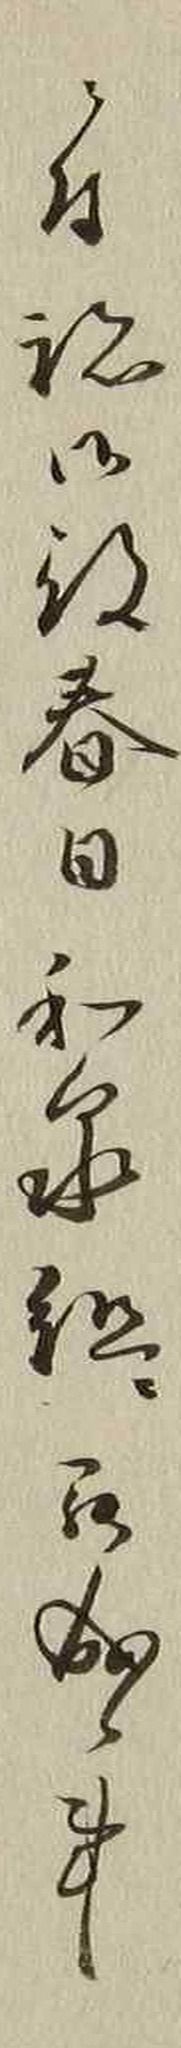ニ付跡御役春日和泉組ニ罷成候事
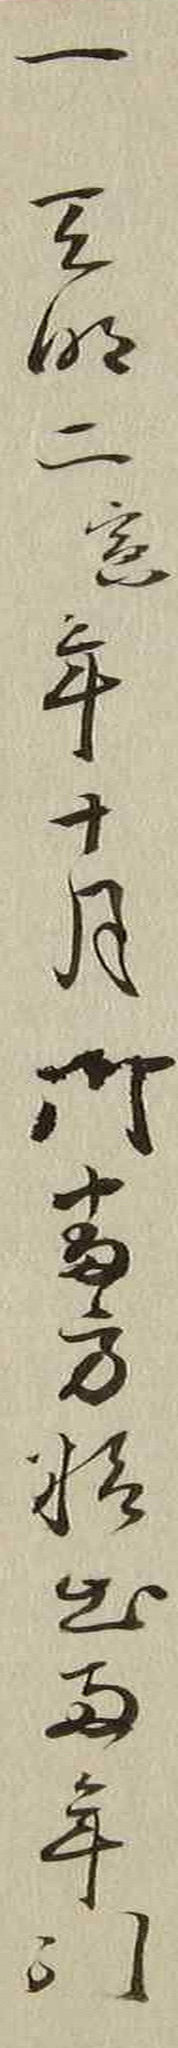一天明二寅年十月御番方精出両年引
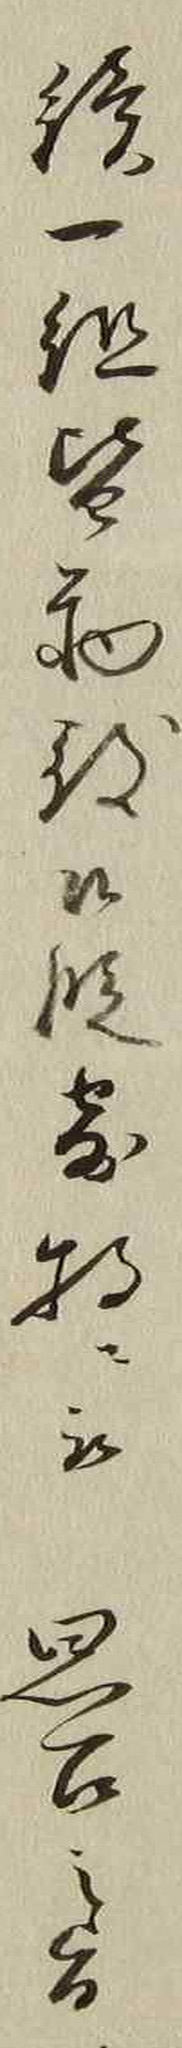続一組皆勤致候段奇特ニ被思召之旨
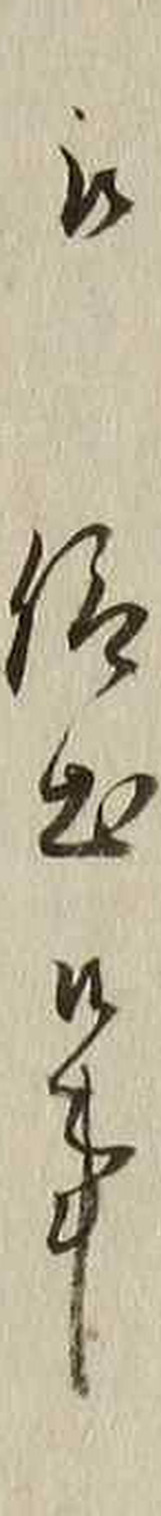被仰出候事
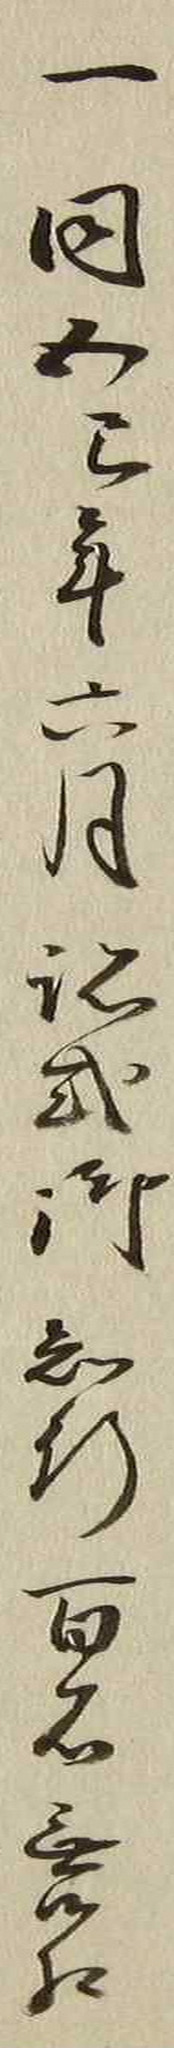一同五巳年六月跡式御知行百石無御相
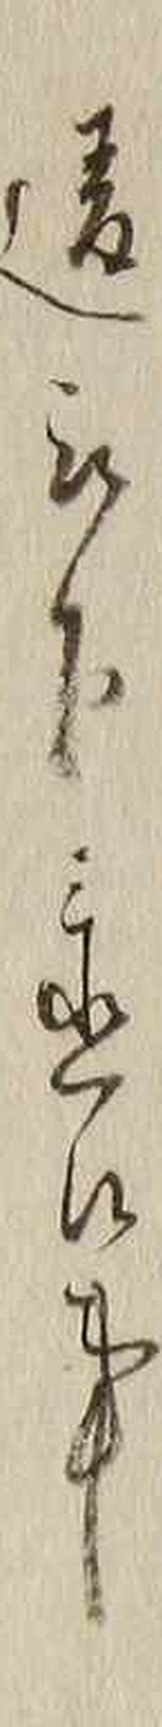違被下置候事
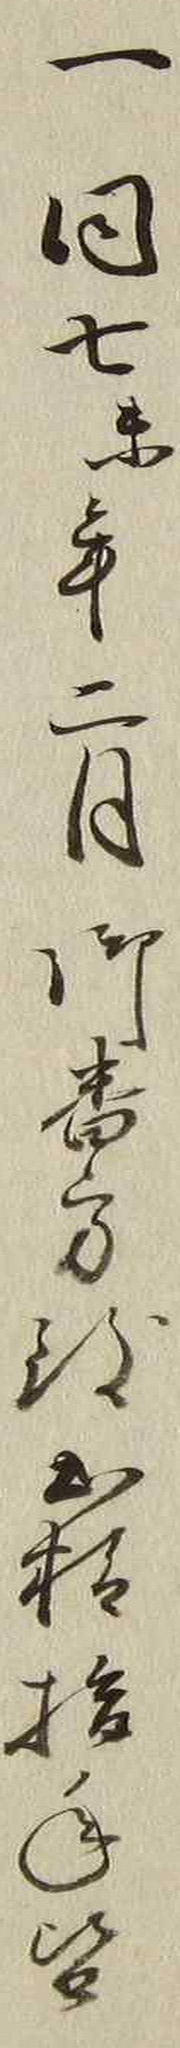一同七未年二月御番方致出精拾年皆
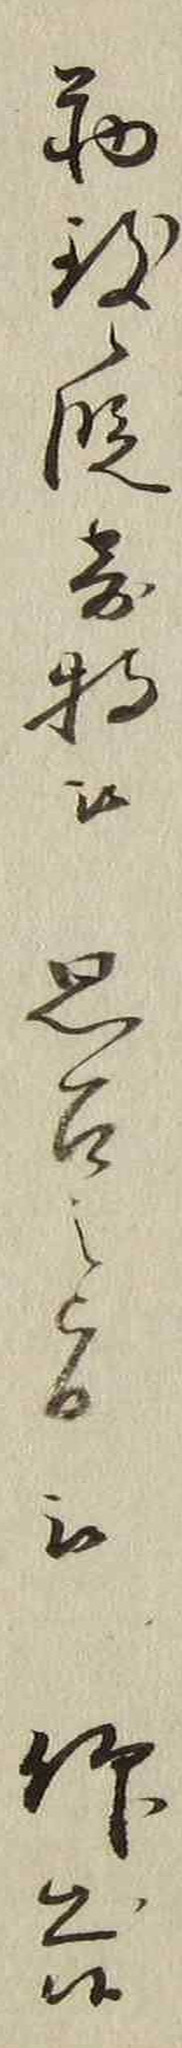勤致候段奇特被思召之旨被仰出候
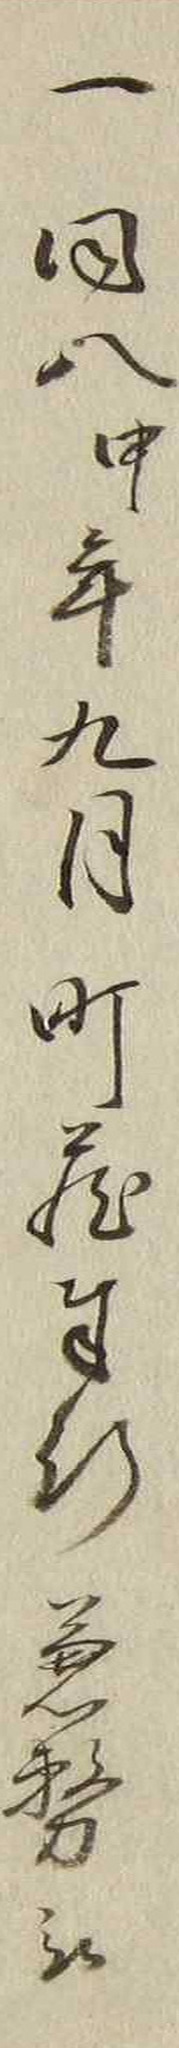一同八申年九月町蔵奉行兼務被
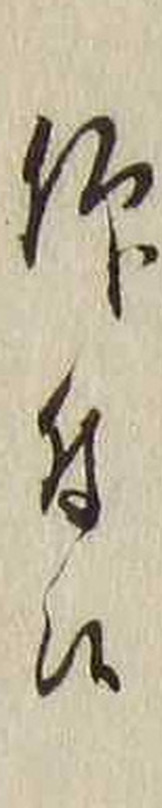仰付候
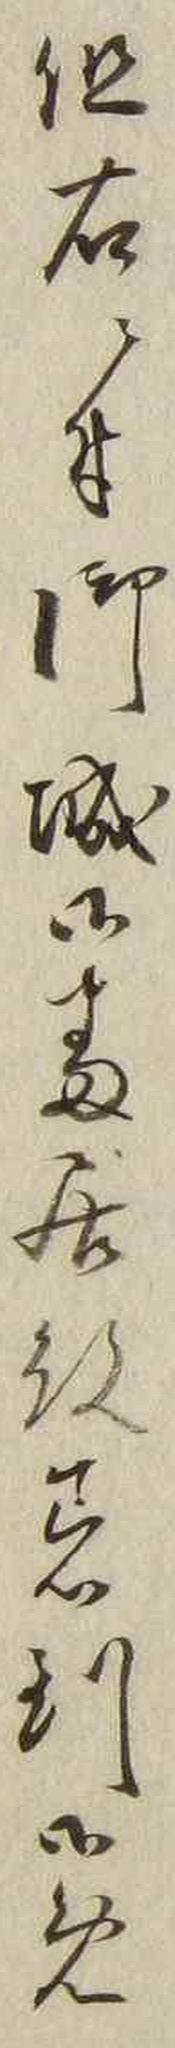但右ニ付御城御番居役着到御免
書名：諸士系譜　巻之25　い之部25
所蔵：会津若松市立会津図書館
